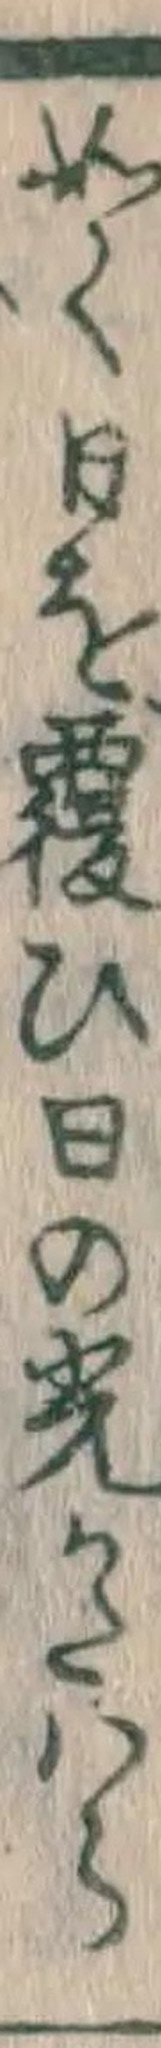如く日を覆ひ日の光かたはら
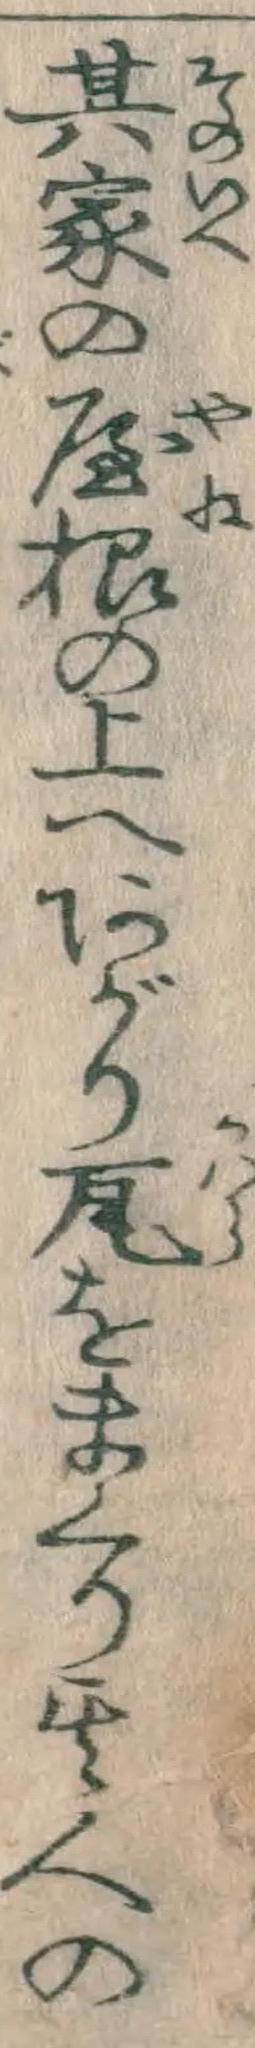其家の屋根の上へあがり瓦をまくり其人の
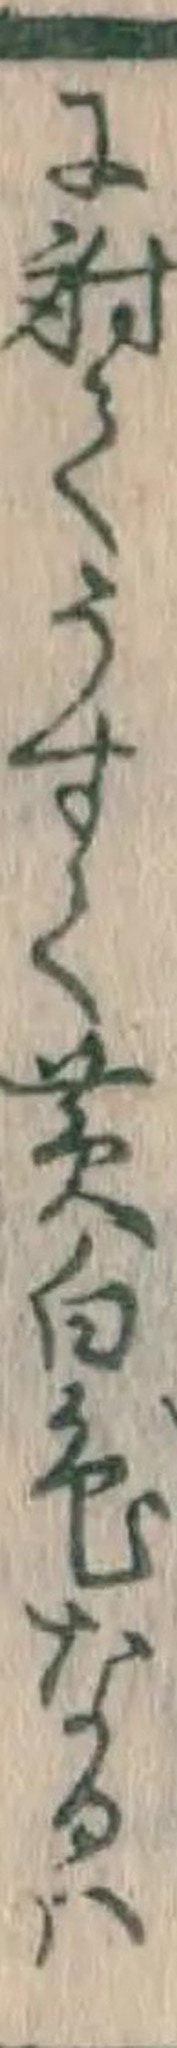に射てうすく黄白色なるは
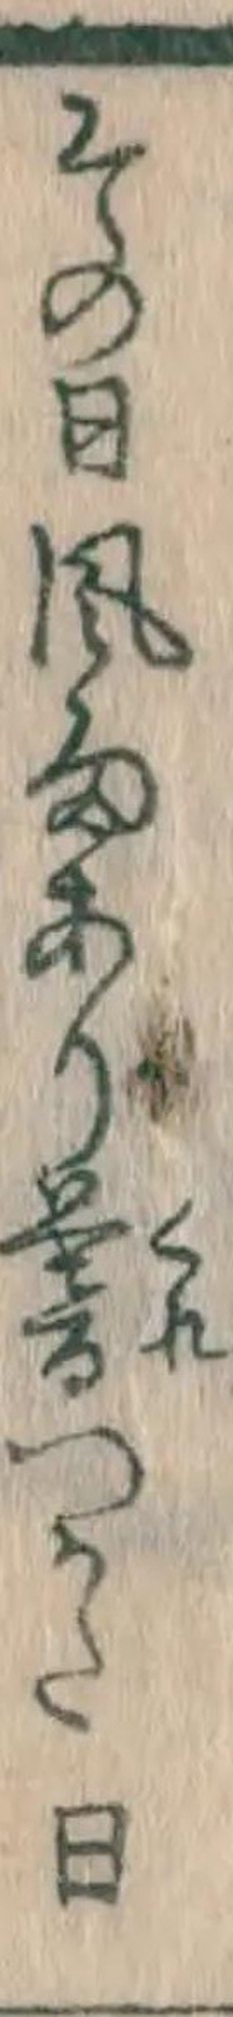その日風雨あり暮つかた日
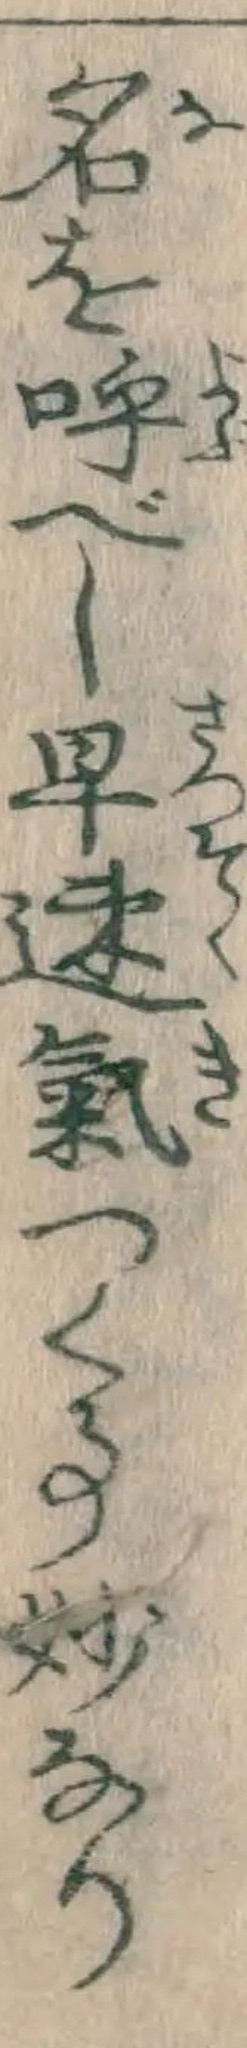名を呼べし早速気つく事妙なり
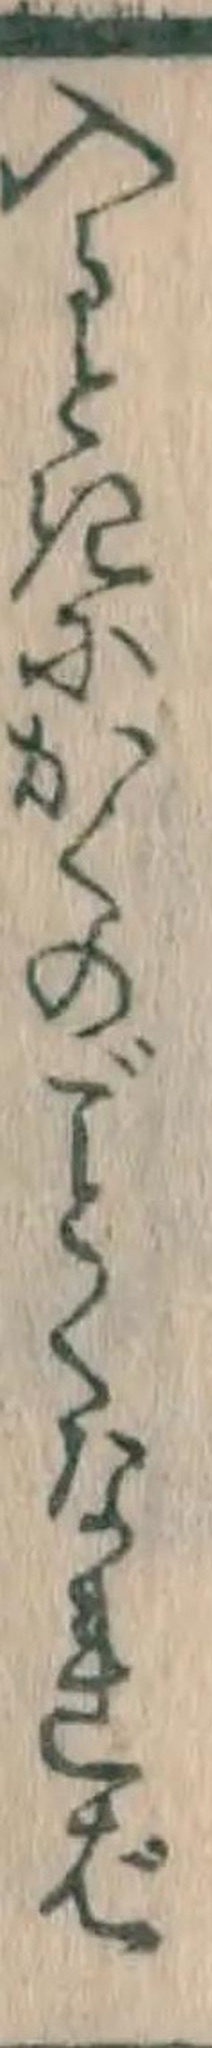入るときにかくのごとくなれば
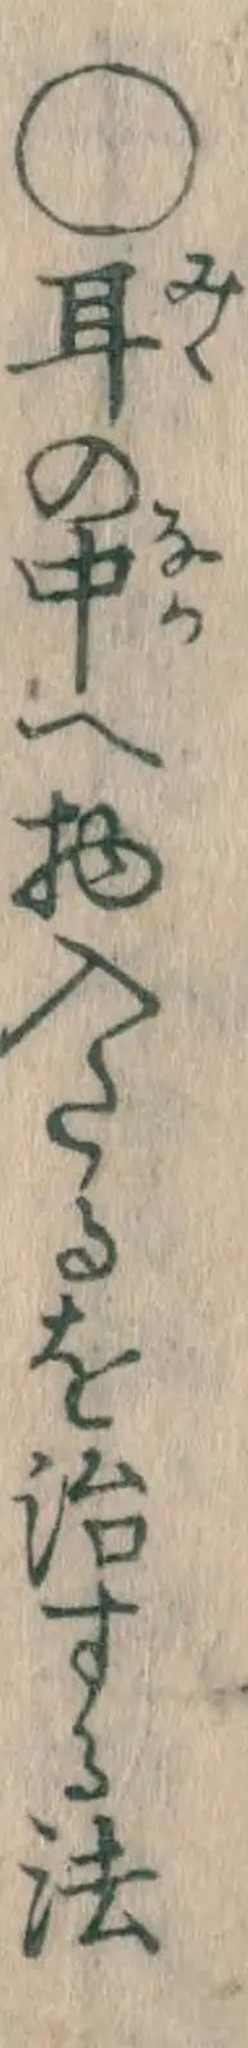○耳の中へ物入たるを治する法

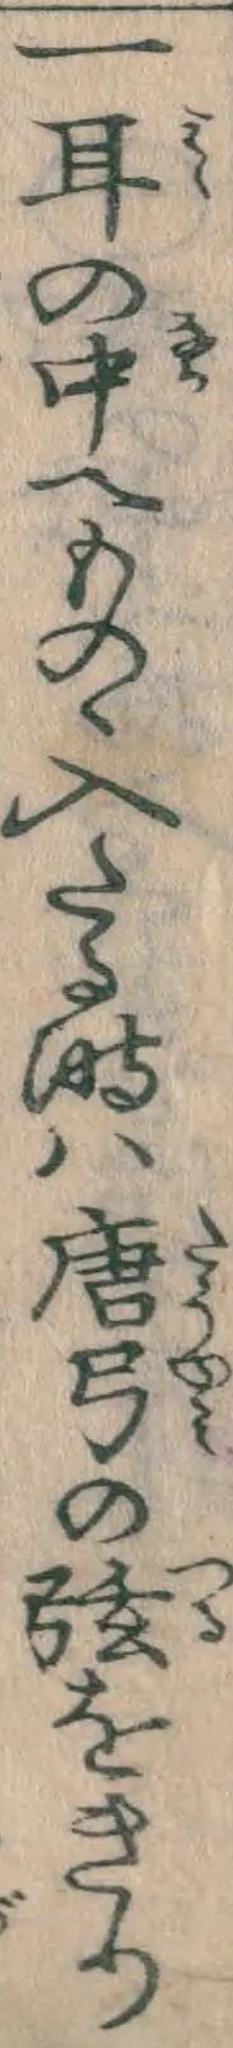一耳の中へものゝ入たる時は唐弓の弦をきり
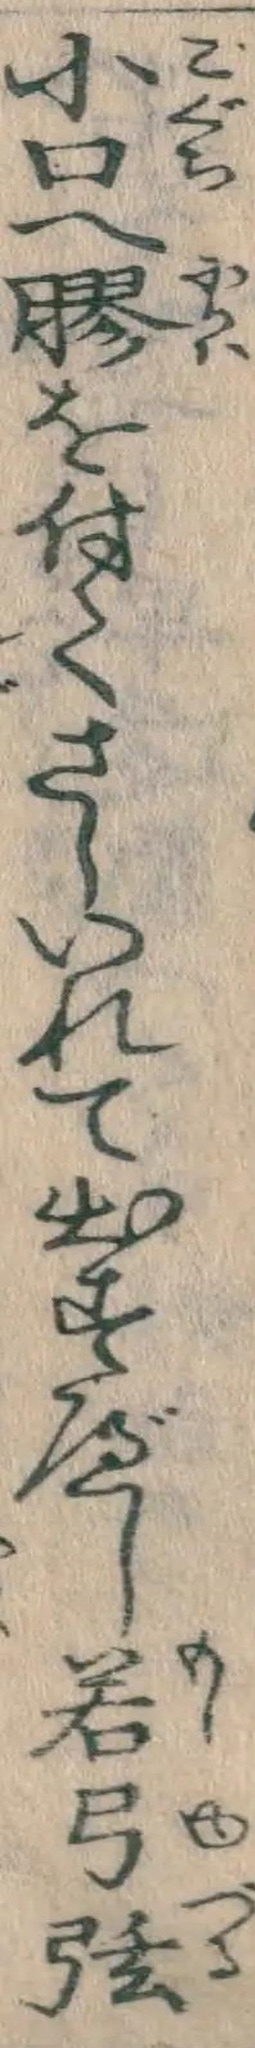小口へ膠を付てさしいれて出すべし若弓弦
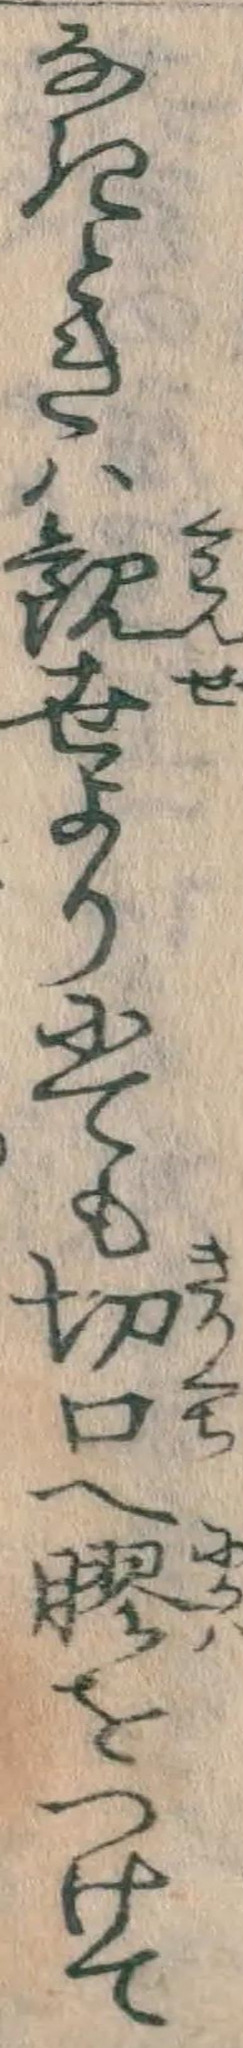なきときは観世よりにても切口へ膠をつけて
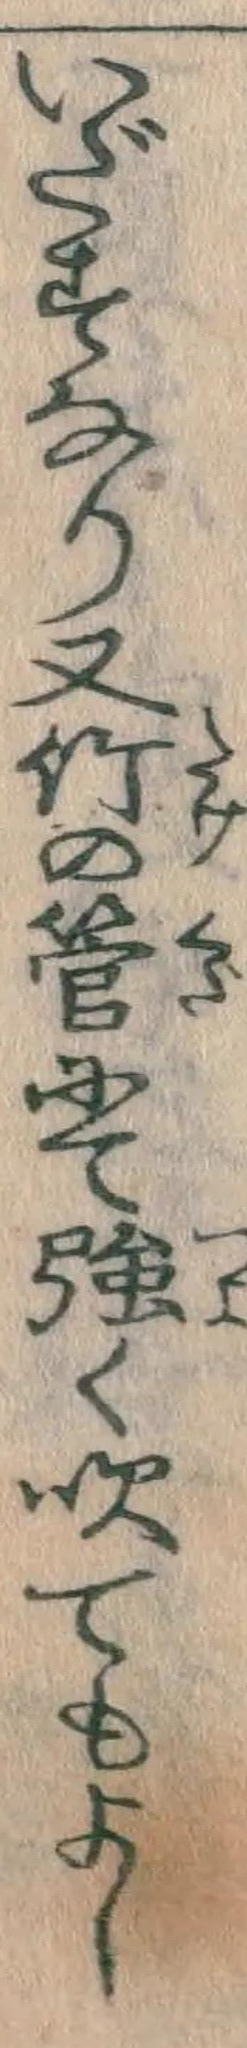いだすなり又竹の管にて強く吹てもよし
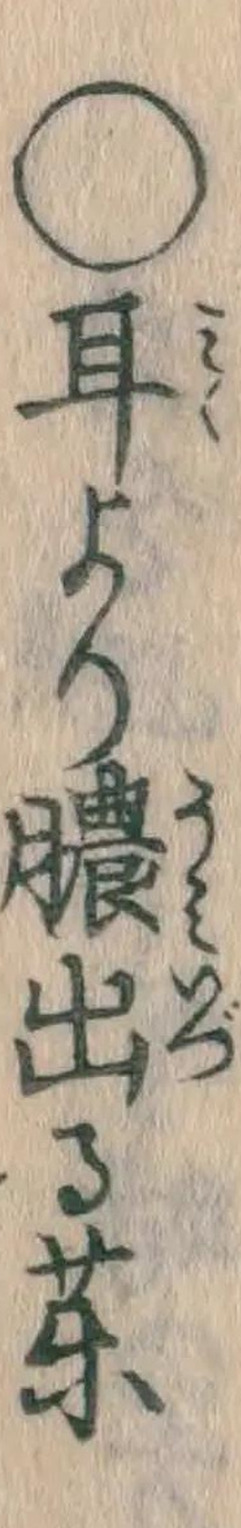○耳より膿出る薬
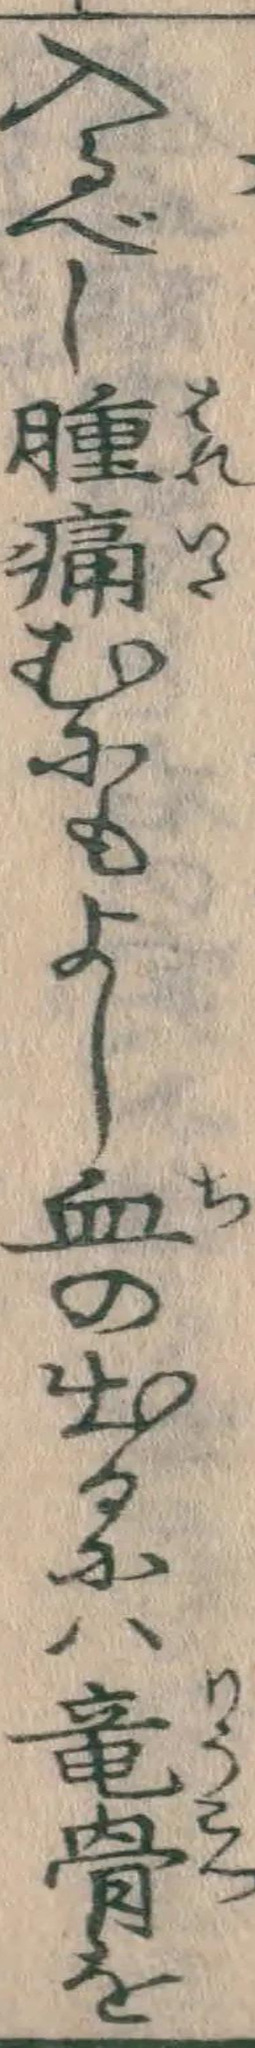入るべし腫痛むにもよし血の出るには竜骨を
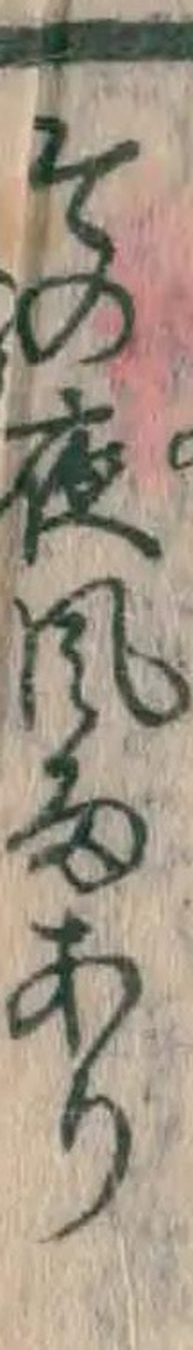その夜風雨あり
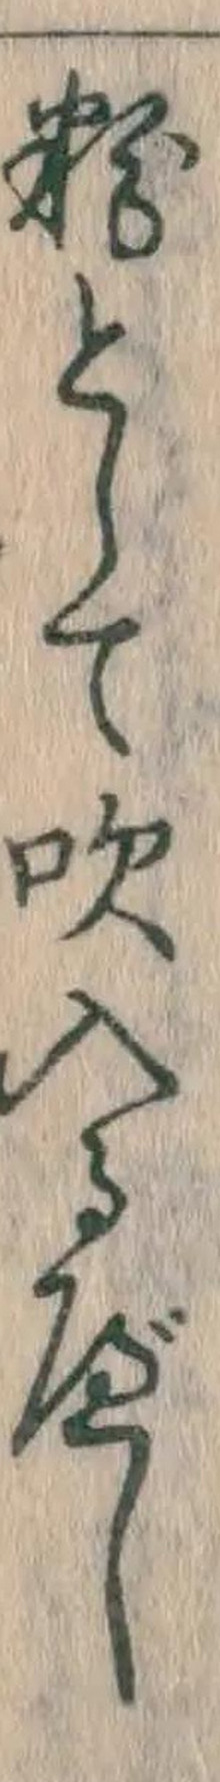粉として吹入るべし
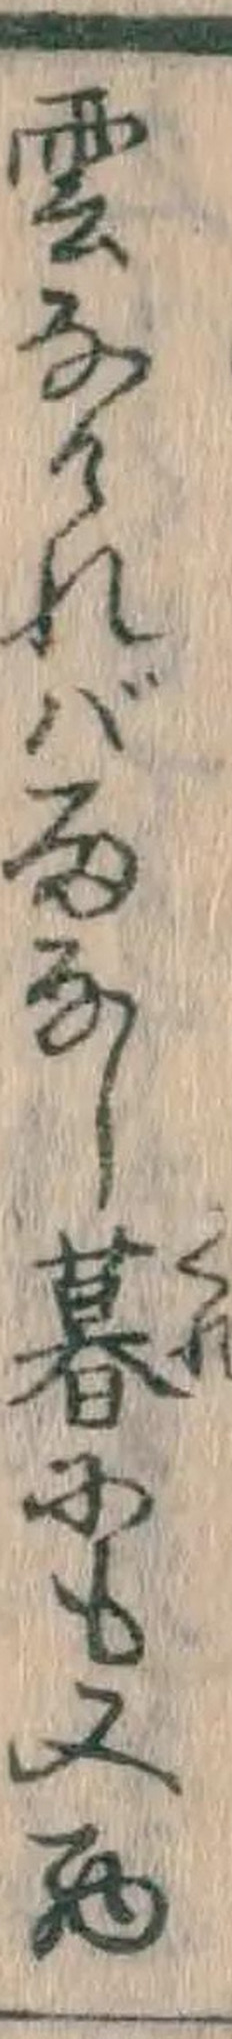雲なければ雨なし暮にも又西
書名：広益秘事大全 3巻. [4]
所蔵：国立国会図書館 National Diet Library, JAPAN
